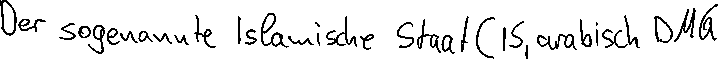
Der sogenannte Islamische Staat (IS, arabisch DMG
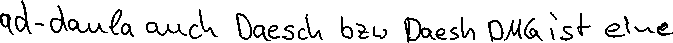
ad-daula auch Daesch bzw. Daesh DMG ist eine
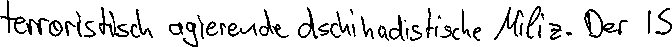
terroristisch agierende dschihadistische Miliz. Der IS
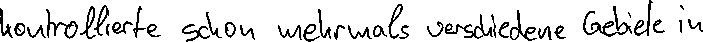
kontrollierte schon mehrmals verschiedene Gebiete in
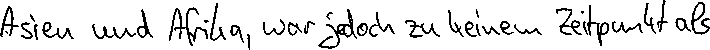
Asien und Afrika, war jedoch zu keinem Zeitpunkt als
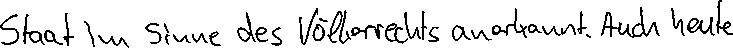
Staat im Sinne des Völkerrechts anerkannt. Auch heute
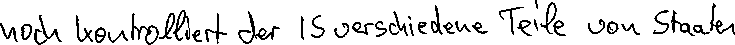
noch kontrolliert der IS verschiedene Teile von Staaten
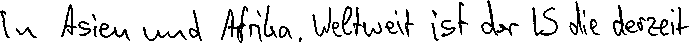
in Asien und Afrika. Weltweit ist der IS die derzeit
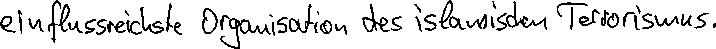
einflussreichste Organisation des islamistischen Terrorismus.
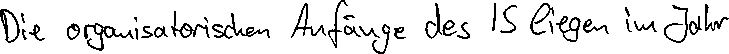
Die organisatorischen Anfänge des IS liegen im Jahr
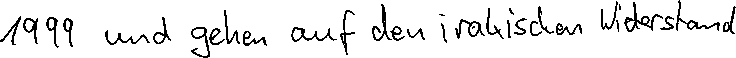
1999 und gehen auf den irakischen Widerstand
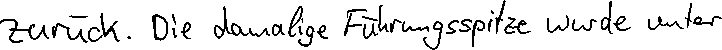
zurück. Die damalige Führungsspitze wurde unter
